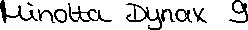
Minolta Dynax 9
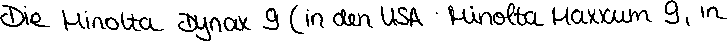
Die Minolta Dynax 9 (in den USA: Minolta Maxxum 9, in
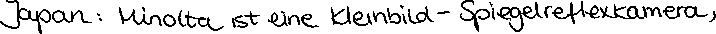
Japan: Minolta ist eine Kleinbild-Spiegelreflexkamera,
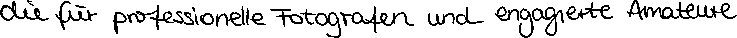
die für professionelle Fotografen und engagierte Amateure
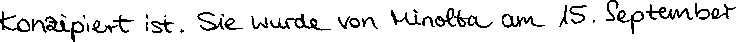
konzipiert ist. Sie wurde von Minolta am 15. September
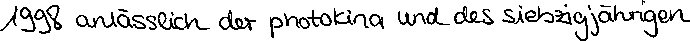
1998 anlässlich der photokina und des siebzigjährigen
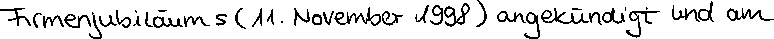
Firmenjubiläums (11. November 1998) angekündigt und am
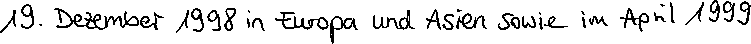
19. Dezember 1998 in Europa und Asien sowie im April 1999
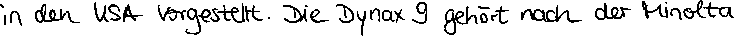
in den USA vorgestellt. Die Dynax 9 gehört nach der Minolta
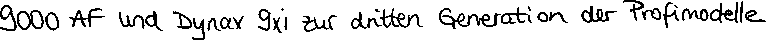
9000 AF und Dynax 9xi zur dritten Generation der Profimodelle
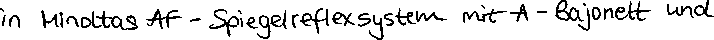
in Minoltas AF-Spiegelreflexsystem mit A-Bajonett und
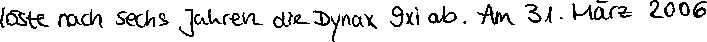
löste nach sechs Jahren die Dynax 9xi ab. Am 31. März 2006
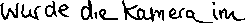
wurde die Kamera im
